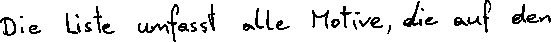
Die Liste umfasst alle Motive, die auf den
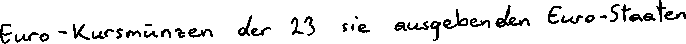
Euro-Kursmünzen der 23 sie ausgebenden Euro-Staaten
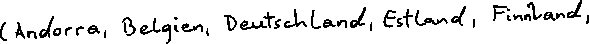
(Andorra, Belgien, Deutschland, Estland, Finnland,
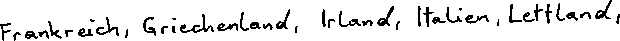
Frankreich, Griechenland, Irland, Italien, Lettland,
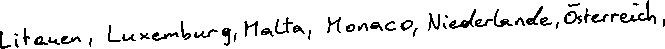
Litauen, Luxemburg, Malta, Monaco, Niederlande, Österreich,
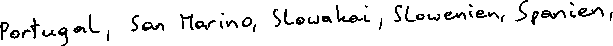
Portugal, San Marino, Slowakei, Slowenien, Spanien,
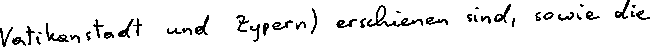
Vatikanstadt und Zypern) erschienen sind, sowie die
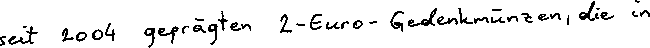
seit 2004 geprägten 2-Euro-Gedenkmünzen, die in
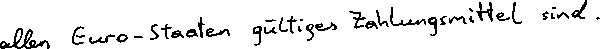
allen Euro-Staaten gültiges Zahlungsmittel sind.
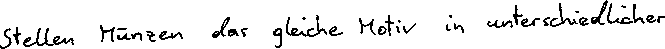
Stellen Münzen das gleiche Motiv in unterschiedlicher
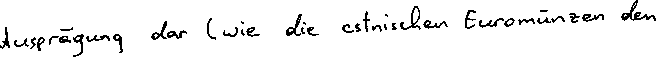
Ausprägung dar (wie die estnischen Euromünzen den
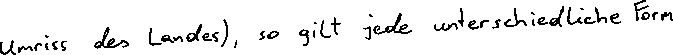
Umriss des Landes), so gilt jede unterschiedliche Form
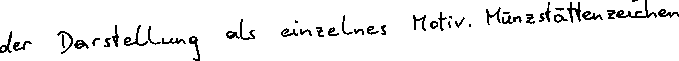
der Darstellung als einzelnes Motiv. Münzstättenzeichen
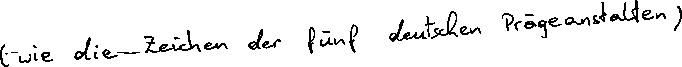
(wie die Zeichen der fünf deutschen Prägeanstalten)
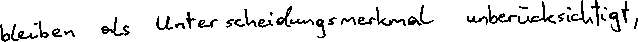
bleiben als Unterscheidungsmerkmal unberücksichtigt,
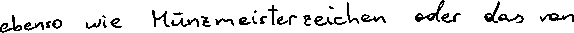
ebenso wie Münzmeisterzeichen oder das von
